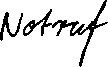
Notruf
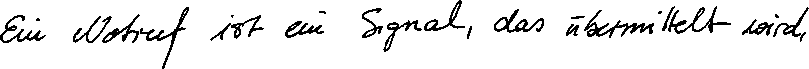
Ein Notruf ist ein Signal, das übermittelt wird,
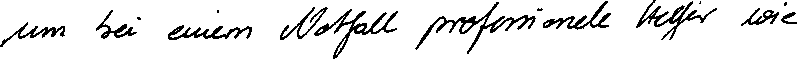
um bei einem Notfall professionelle Helfer wie
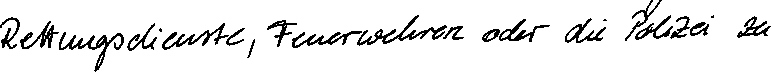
Rettungsdienste, Feuerwehren oder die Polizei zu
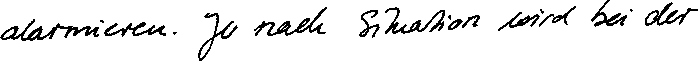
alarmieren. Je nach Situation wird bei der
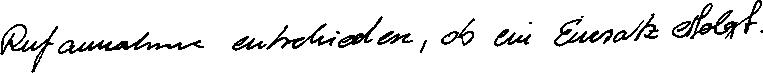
Rufannahme entschieden, ob ein Einsatz erfolgt.
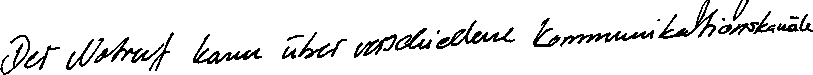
Der Notruf kann über verschiedene Kommunikationskanäle
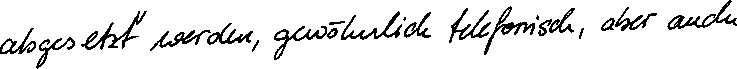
abgesetzt werden, gewöhnlich telefonisch, aber auch
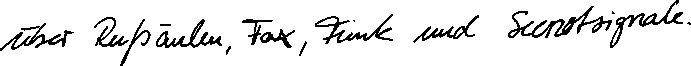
über Rufsäulen, Fax, Funk und Seenotsignale.
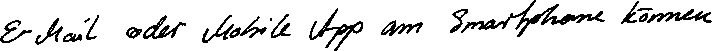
E-Mail oder Mobile App am Smartphone können
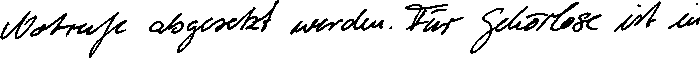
Notrufe abgesetzt werden. Für Gehörlose ist in
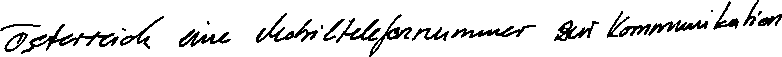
Österreich eine Mobiltelefonnummer zur Kommunikation
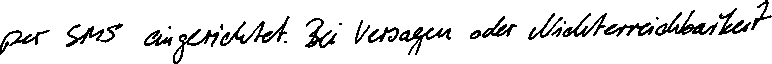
per SMS eingerichtet. Bei Versagen oder Nichterreichbarkeit
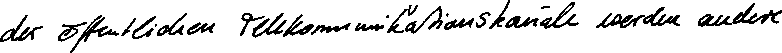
der öffentlichen Telekommunikationskanäle werden andere
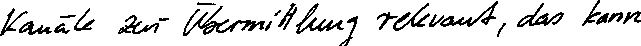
Kanäle zur Übermittlung relevant, das kann
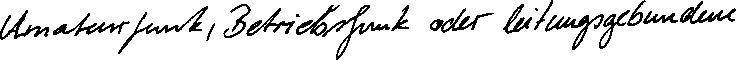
Amateurfunk, Betriebsfunk oder leitungsgebundene
